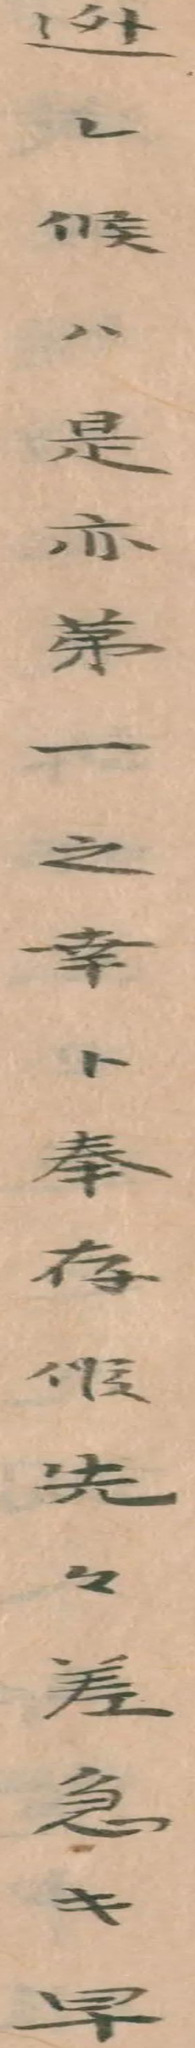逃レ候ハ是亦第一之幸ト奉存候先々差急キ早
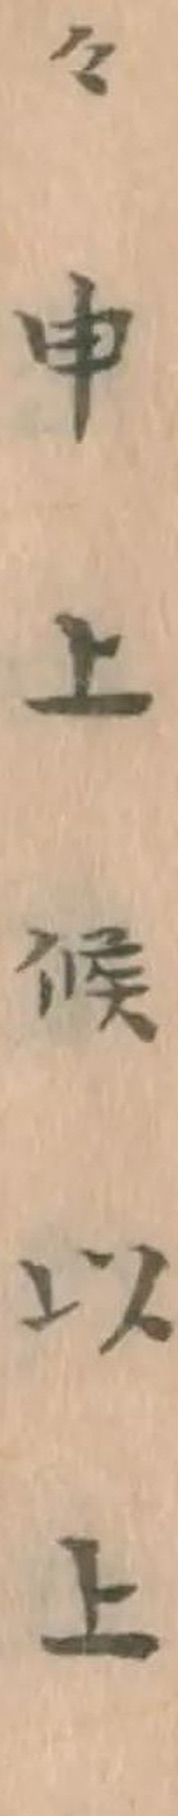々申上候以上
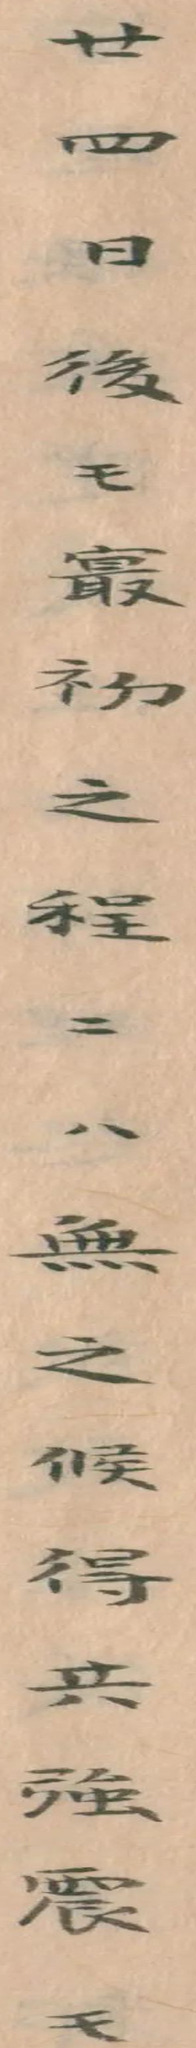廿四日後モ最初之程ニハ無之幸得共強震モ
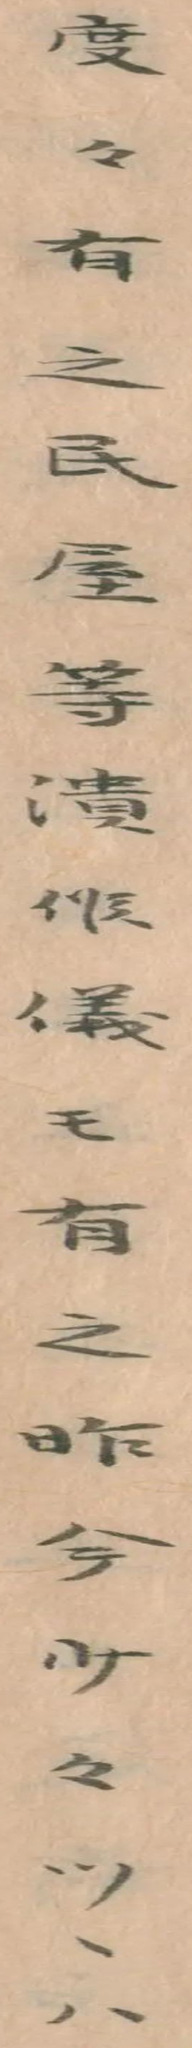度々有之民屋等潰候儀モ有之昨今少々ツゝハ

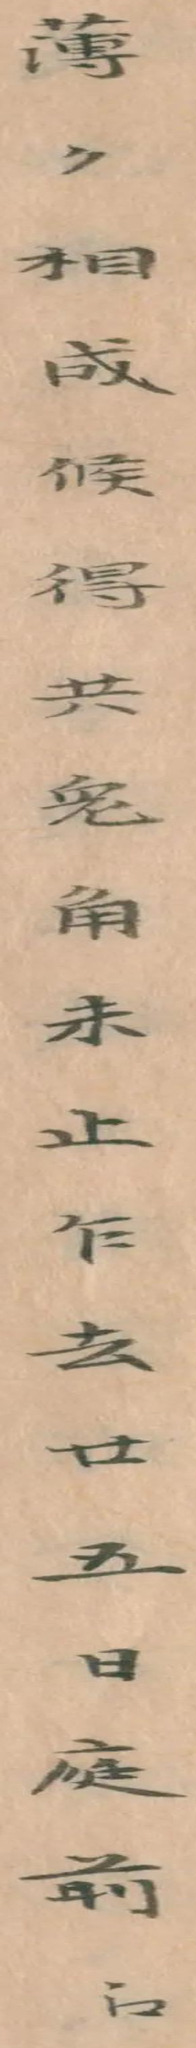薄ク相成候得共兎角未止乍去廿五日庭前江
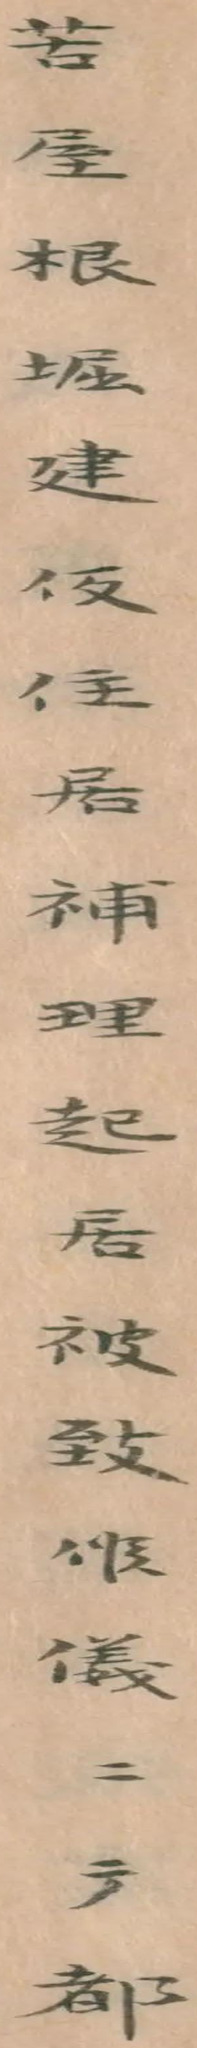苫屋根堀建仮住居補理起居被致候儀二テ都
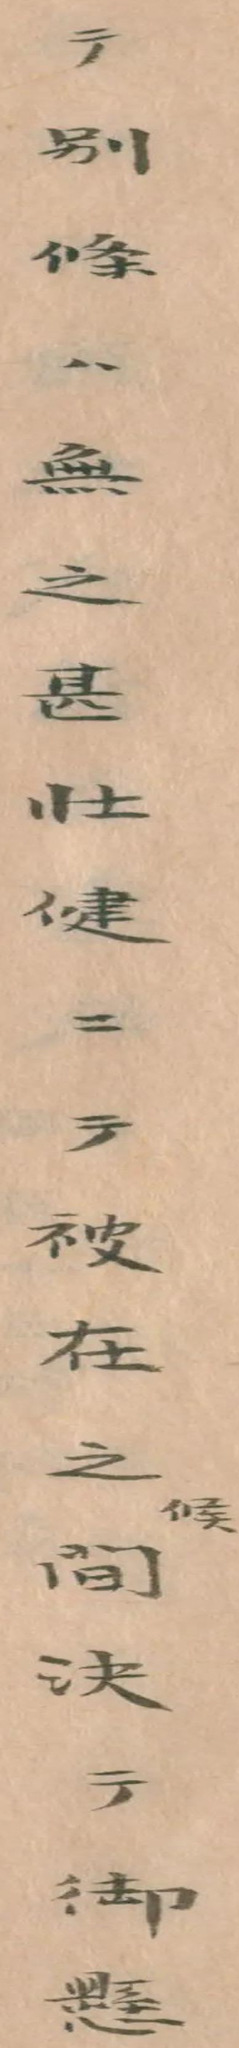テ別条ハ無之甚壮健ニテ被在之候間決テ御懸
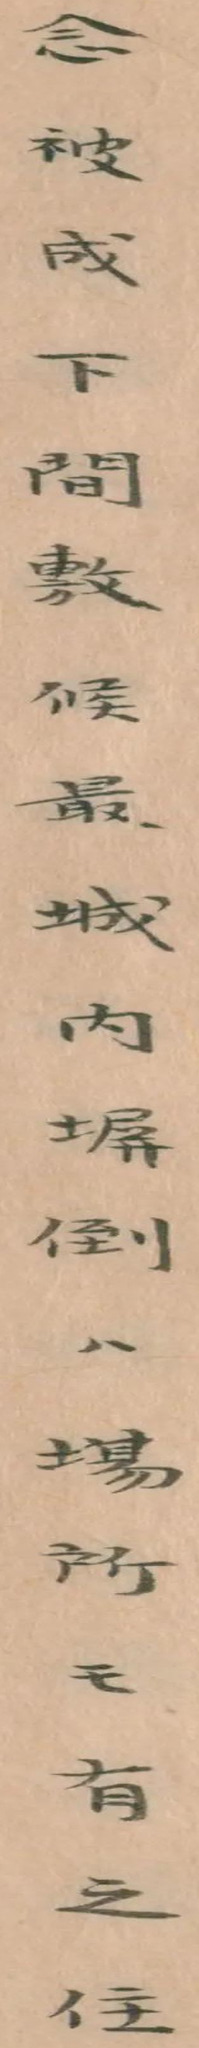念被成下間敷候最城内塀倒ハ場所モ有之住
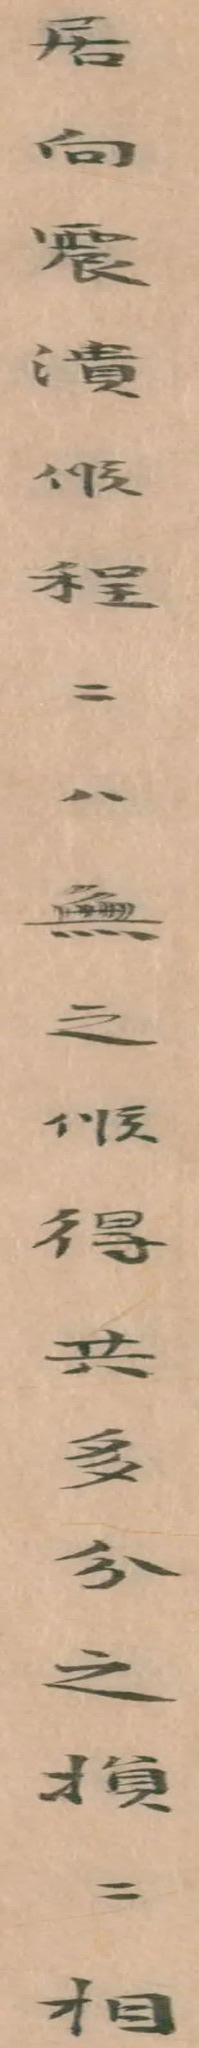居向震潰候程ニハ無之候得共多分之損ニ相
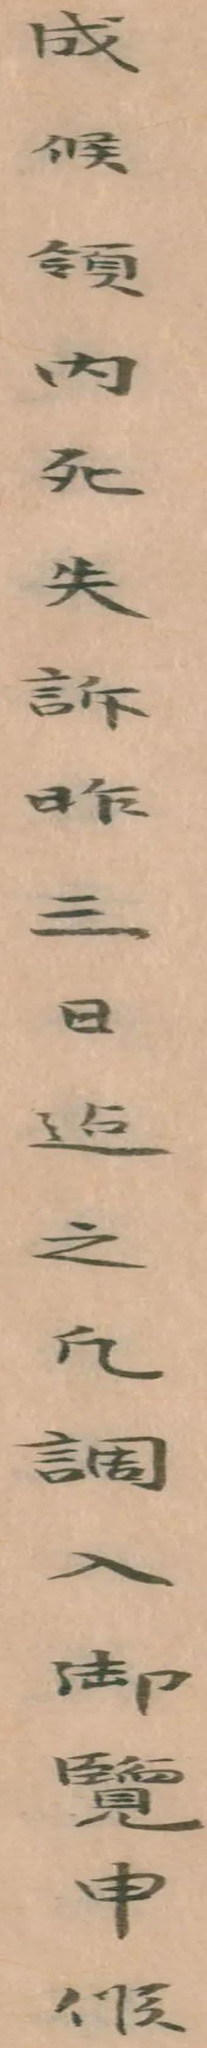成候領内死失訴昨三日迄之凡調入御覧震候
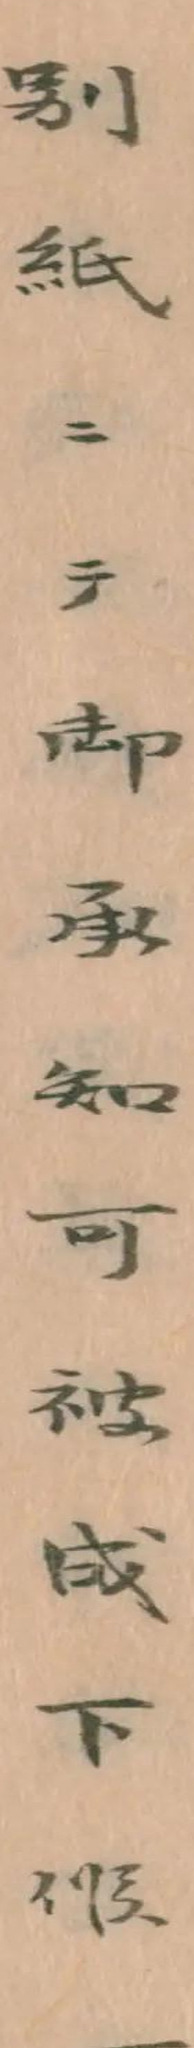別紙ニテ御承知可被成下候下畧
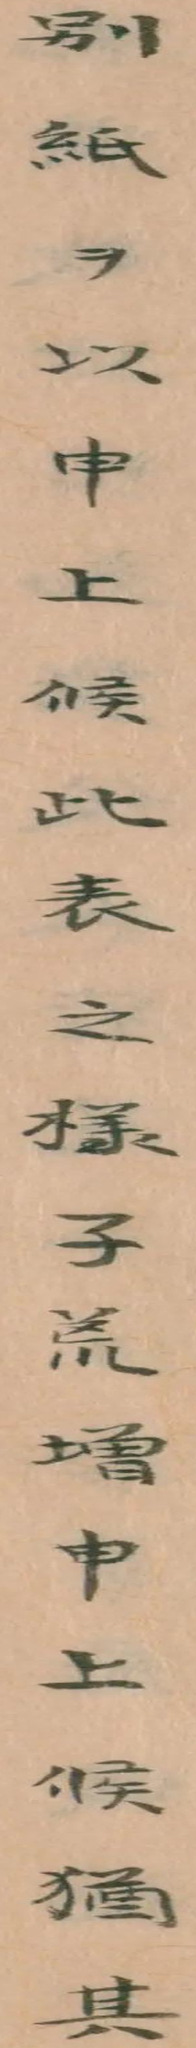別紙ヲ以震上候此表之様子荒増申上候猶其
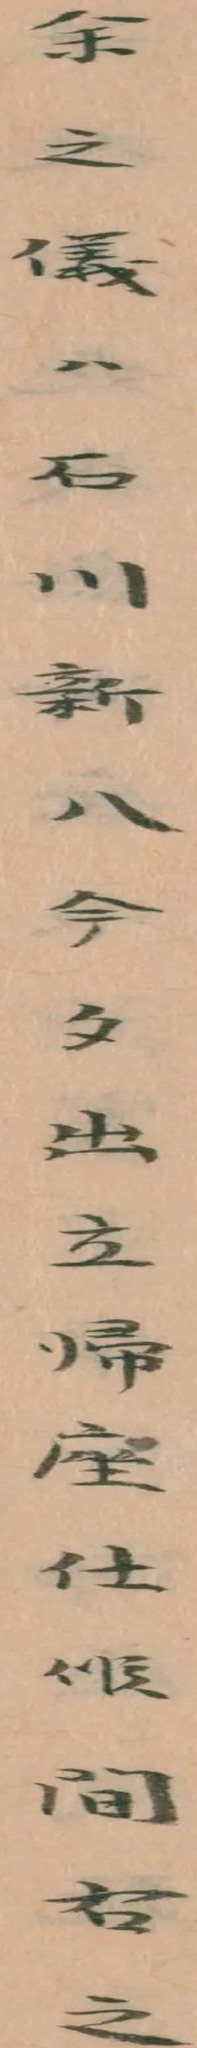余之儀ハ石川新八今タ出立帰座仕候間右之
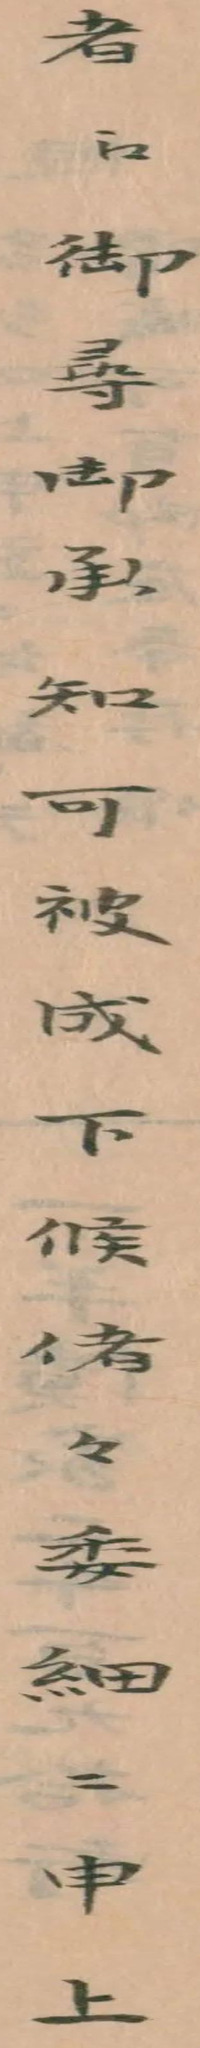者江御尋御承知可被成下候偖々委細二申上
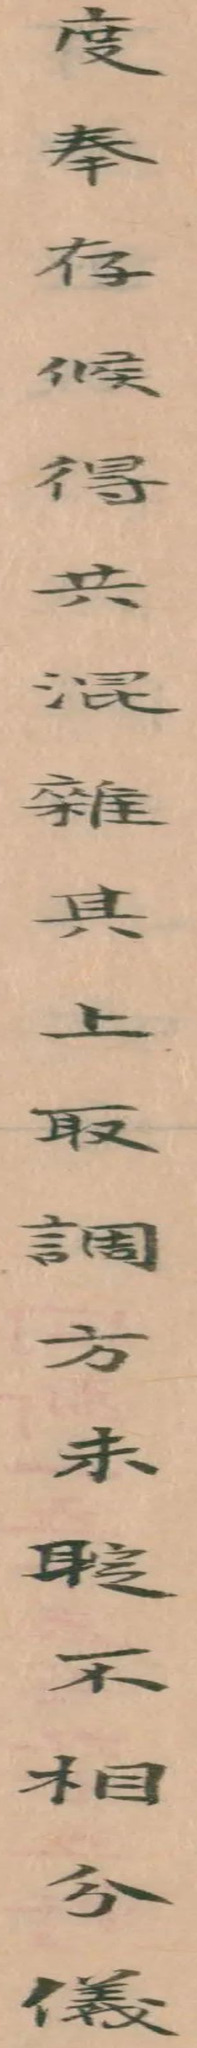度奉存候得共混雑其上取調方未̪聢不相分儀
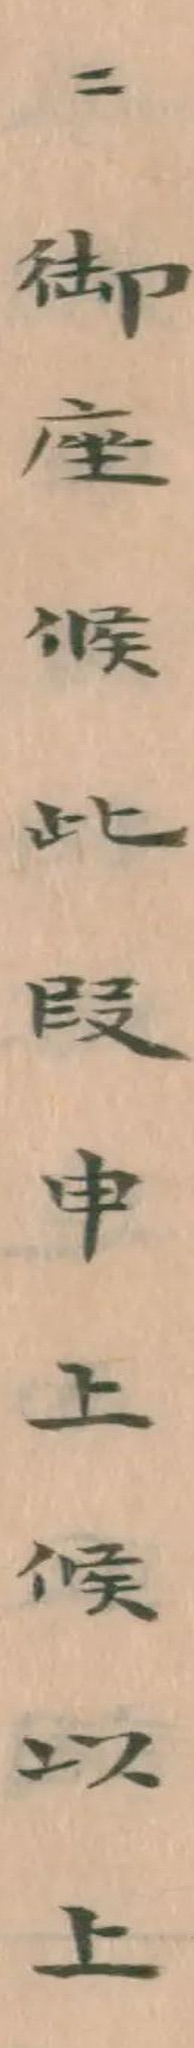二御座候此段申上候以上
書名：地災撮要. 巻1(噴火山・地震ノ部)
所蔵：国立国会図書館 National Diet Library, JAPAN
